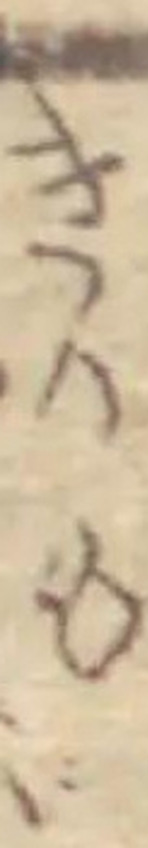きりも
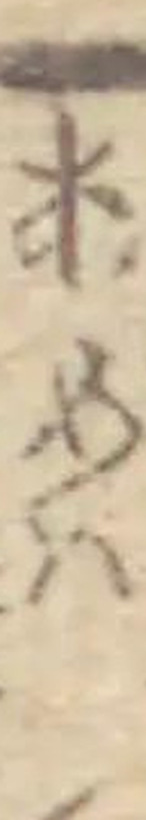あめは
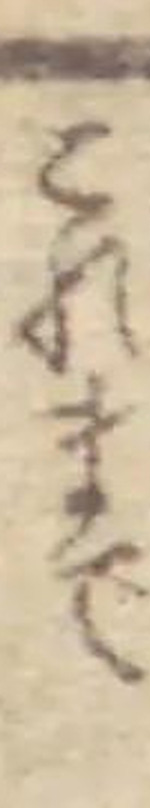これまで
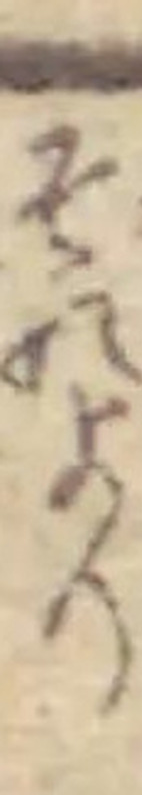それより
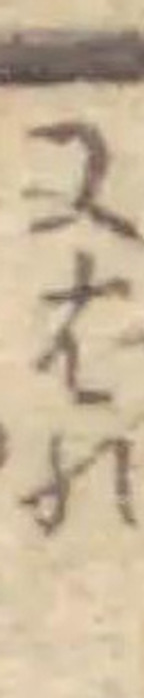又はれ
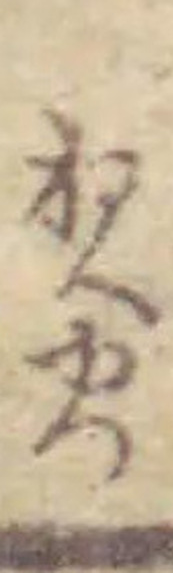ねへやつ
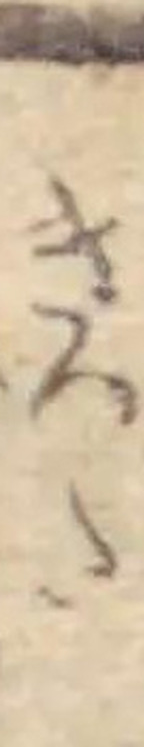きつた

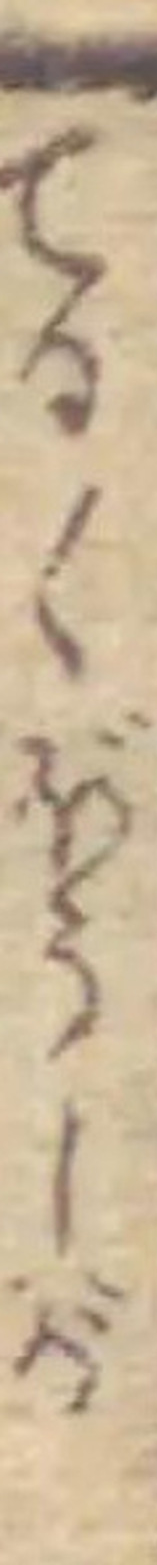てる〳〵ぼうしが
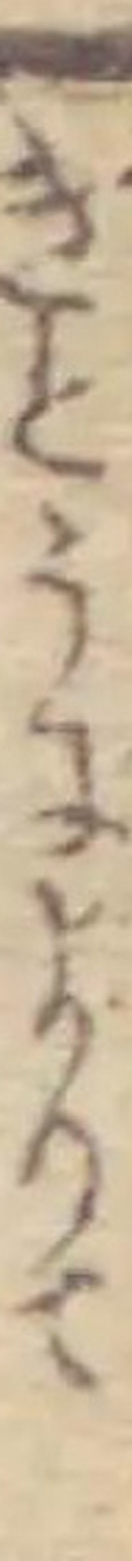きとうによりて
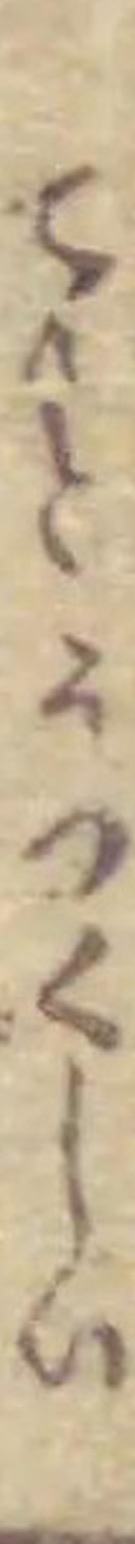てんとうつくしい
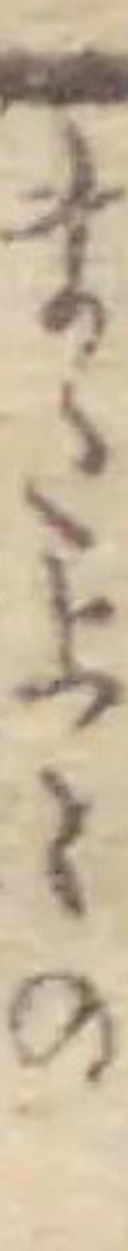また上々の
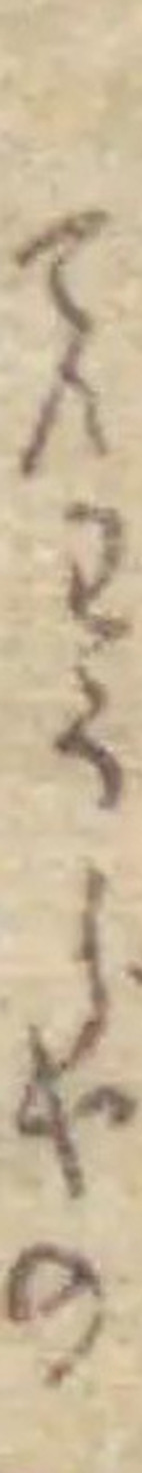てんわうじやの
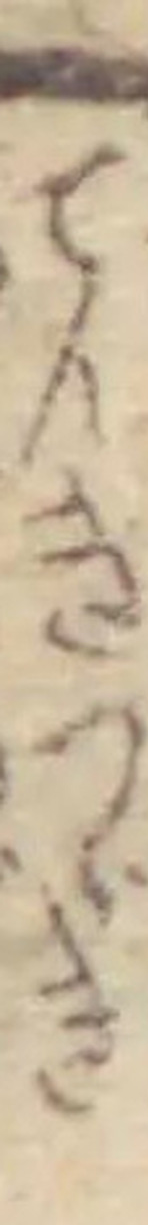てんきつゞき
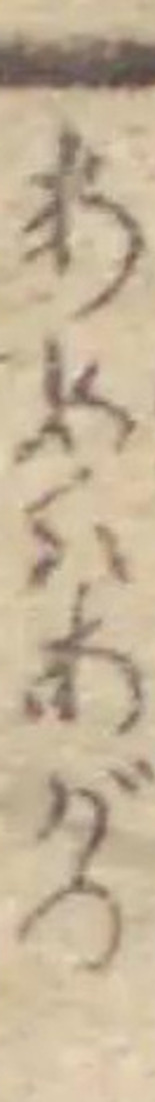あめはあがつ
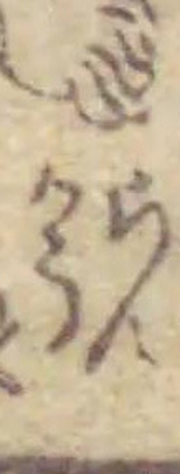かうと
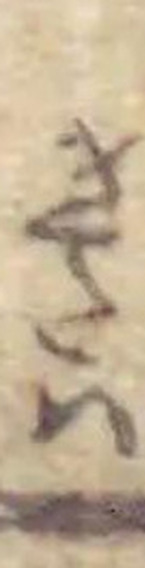きたは
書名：雨宮風宮出儘略縁記 3巻
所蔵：国立国会図書館 National Diet Library, JAPAN
